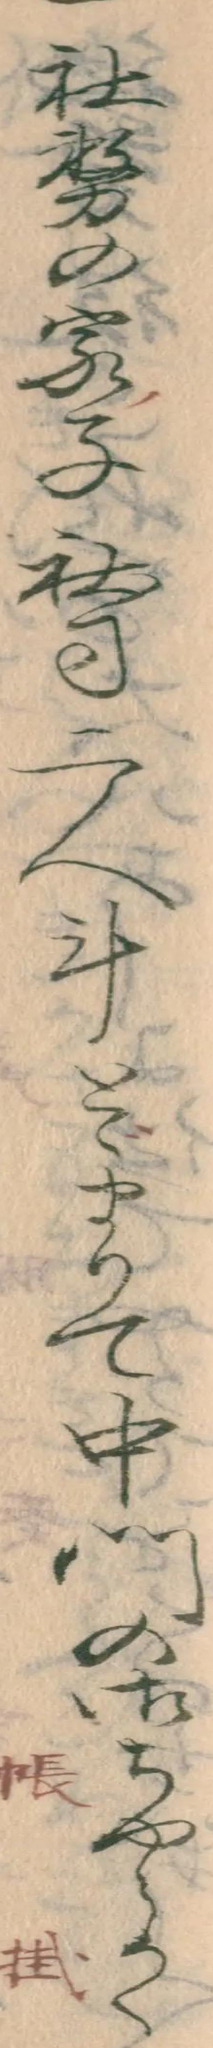一社務の家子社司二人計とゞまりて中門の御ちやうかく
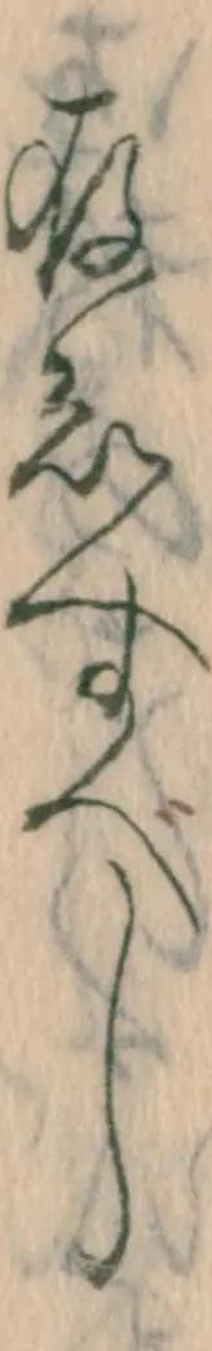存知すべし

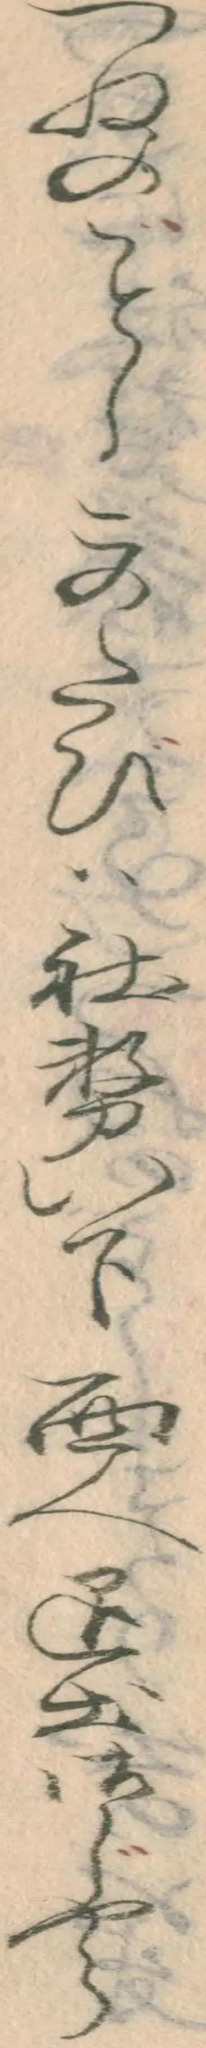つねのごとしこのたびは社務い下西人退出御じやう
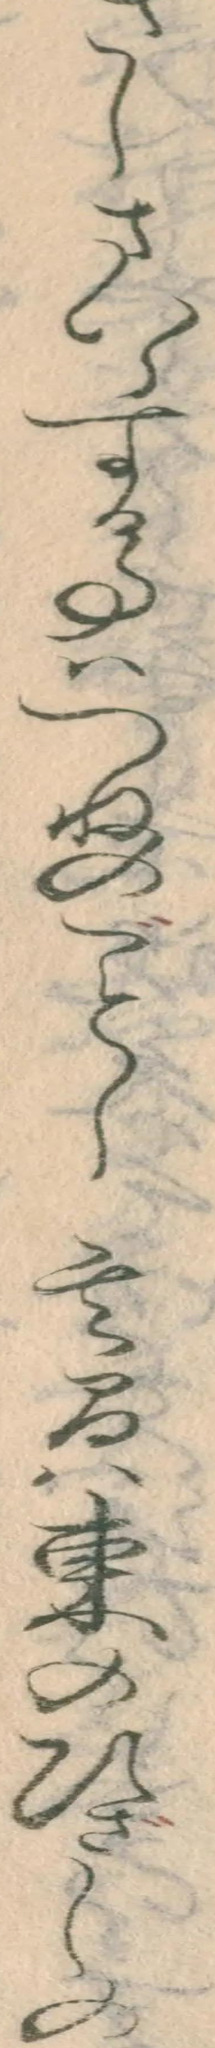さしまいらする事はつねのごとし其間は東のひざしの
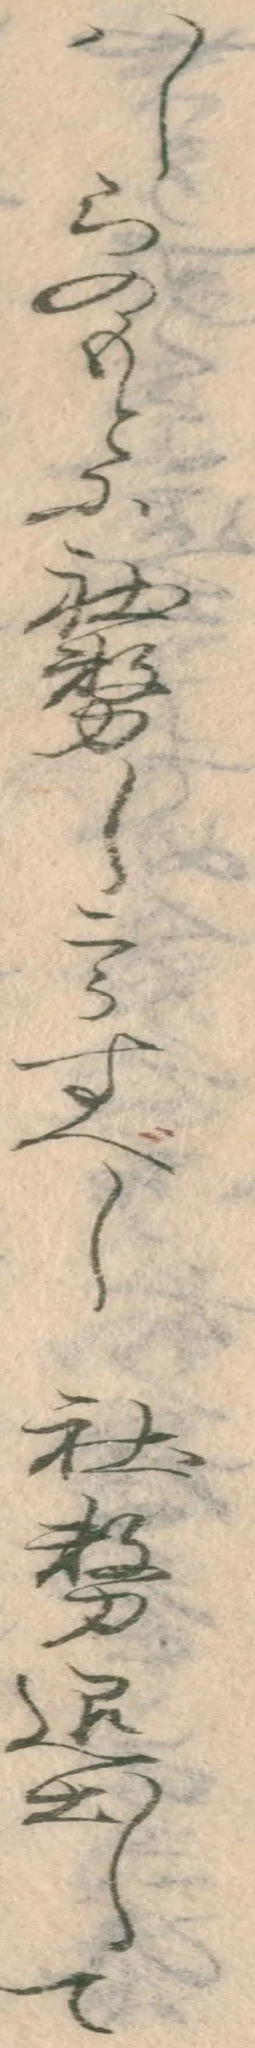はしらのもとに社務しこうすべし社務退出して
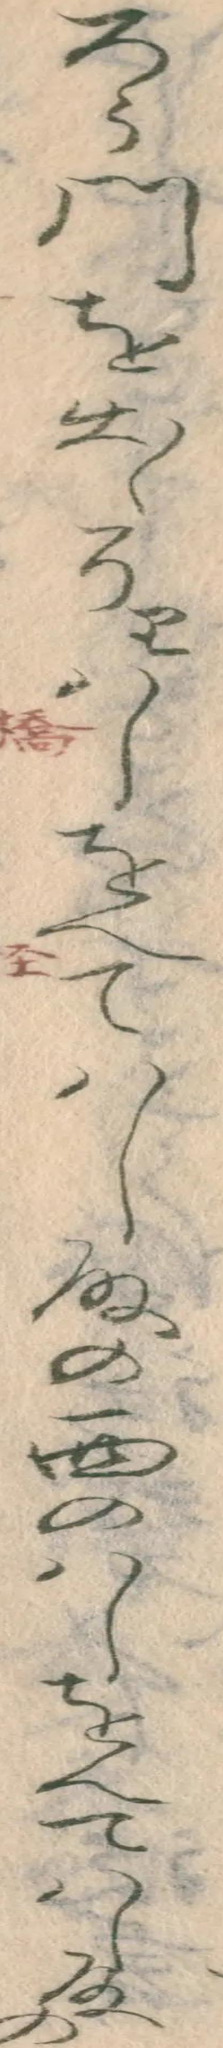ろう門を出候そりはしをへてはし殿の西のはしをへてはし殿の
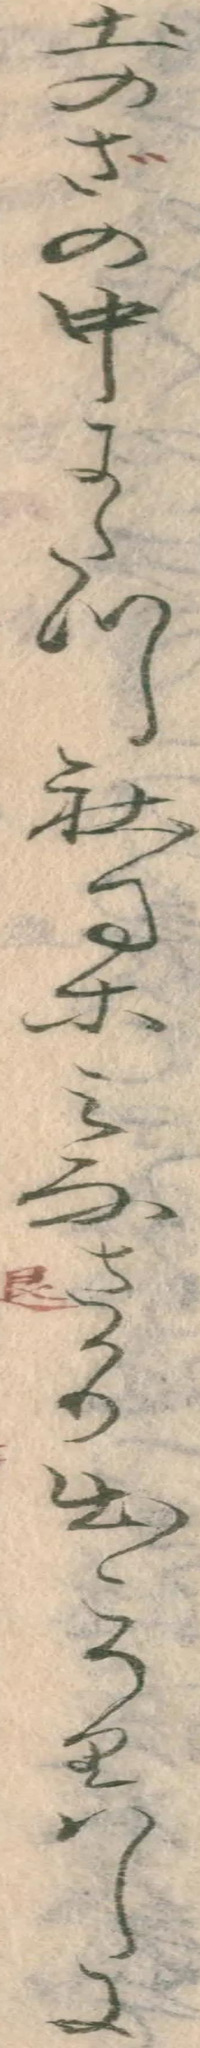土のざの中にたつ社司等みなさかり出候そりはしに
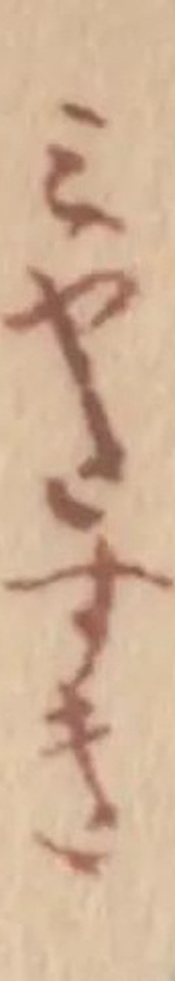みやたすき
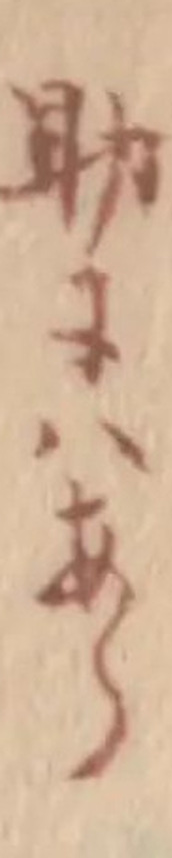助にはあら
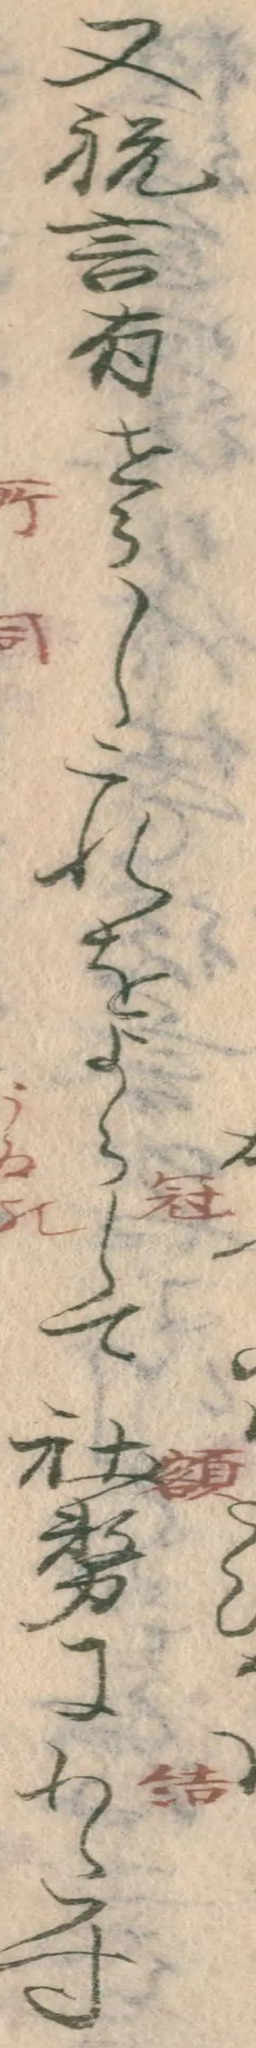又祝言有せうしこれをよして社務にわたす
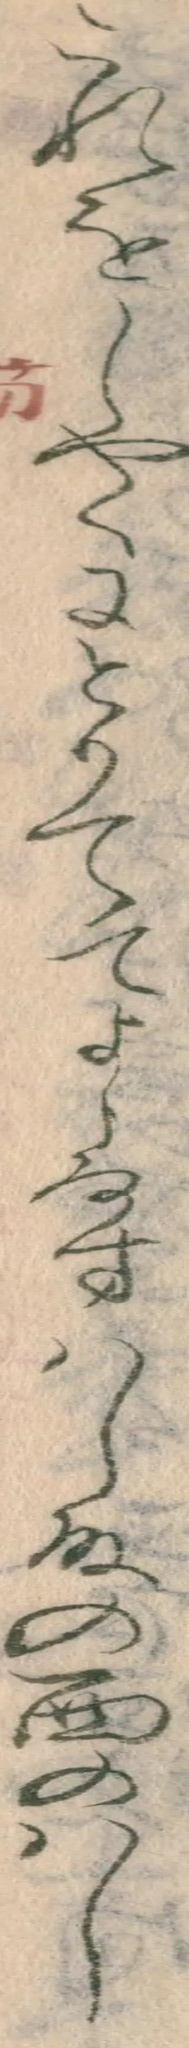これをしやくにとりてようゐすはし殿の西
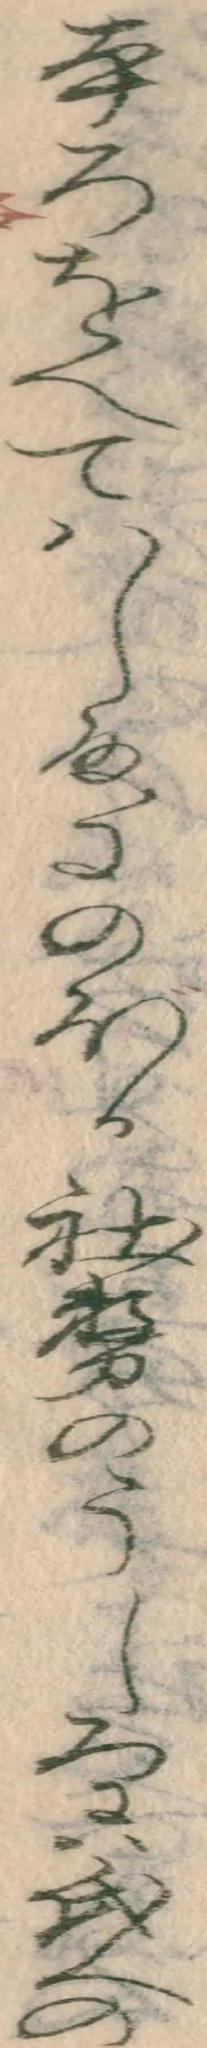本ろをへてはし殿にのぼる社務のうしろには氏人の
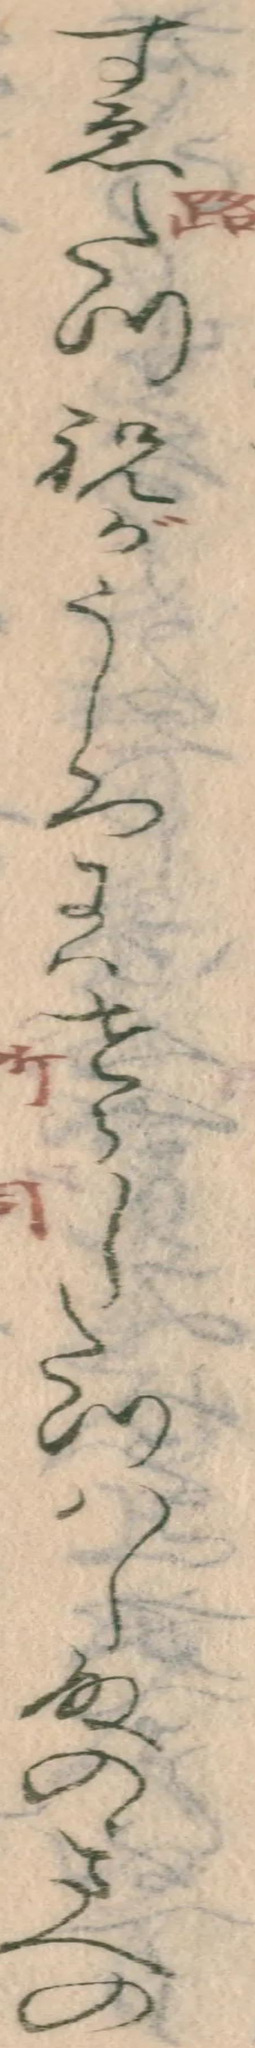すゑたつ祝がうしろにはせうしたつはし殿のまへの
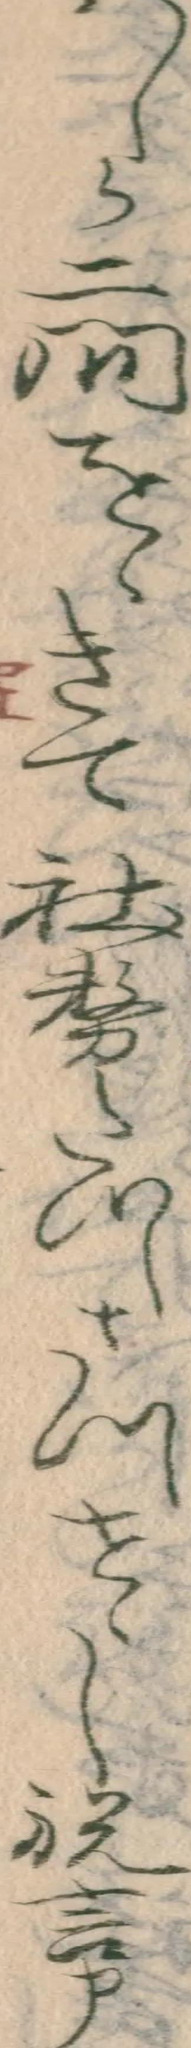はしら二間をゝきて社務たつまつせゝし祝言申
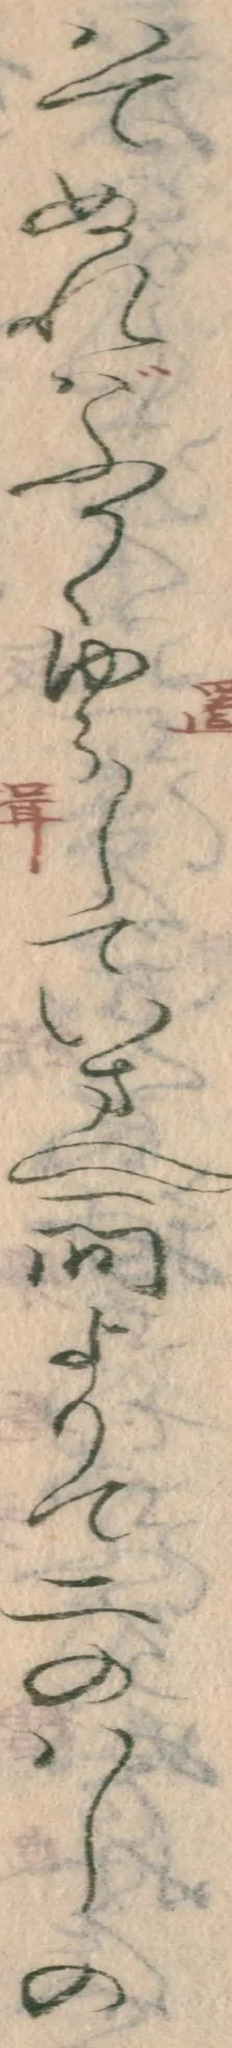はてぬればふかくゆうしていま一間よりて二のはしの
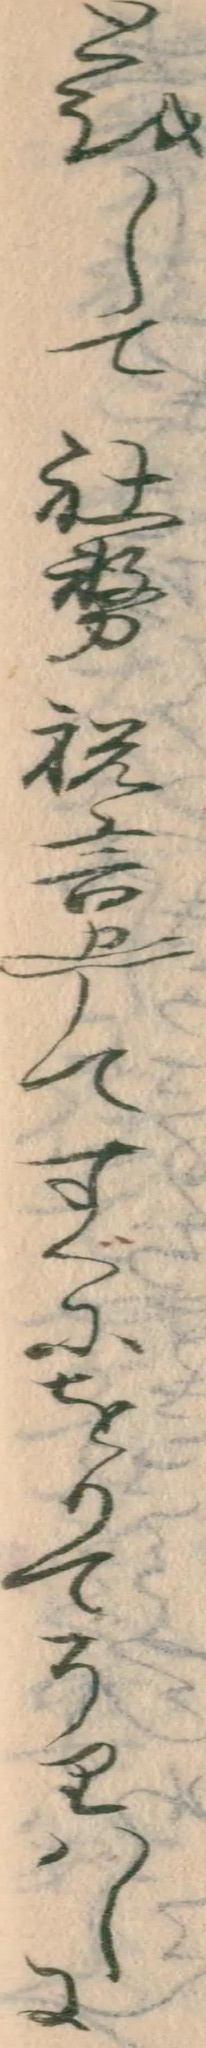とをして社務祝言上申してすぐにをりてそりはしに
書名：賀茂社記録. 第3冊
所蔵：国立国会図書館 National Diet Library, JAPAN
